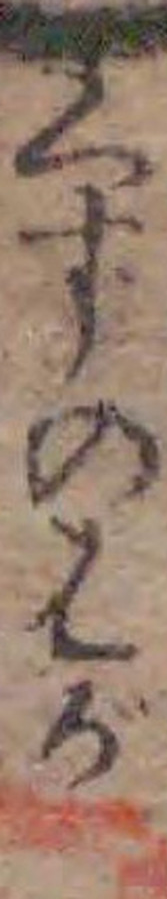くすのはが
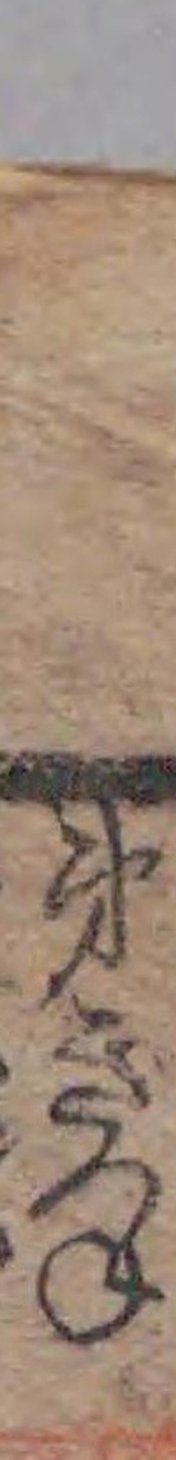弟きつね
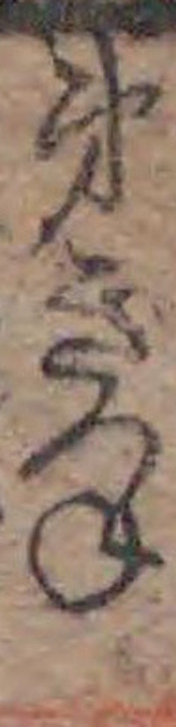弟きつね
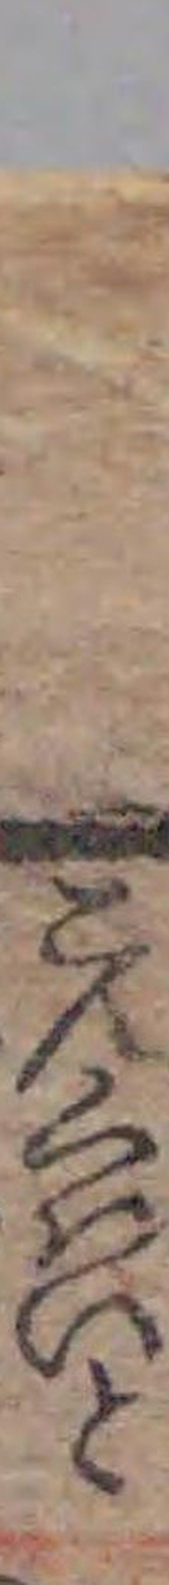こんくはいと
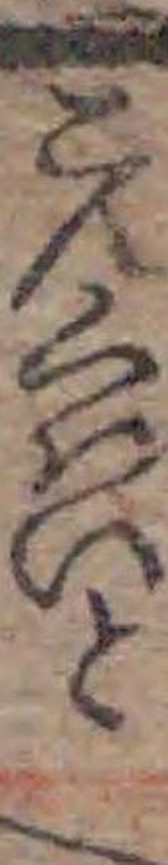こんくはいと
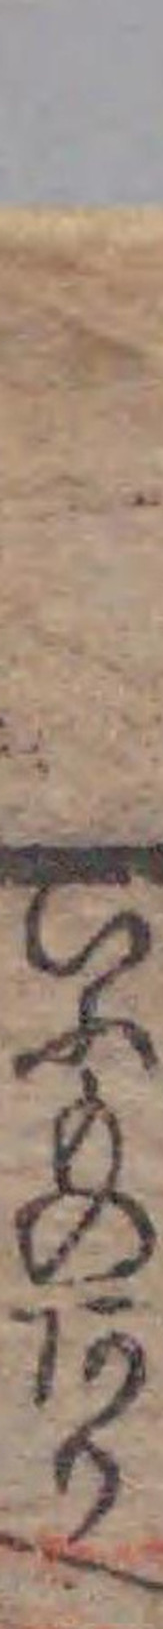いふものあり
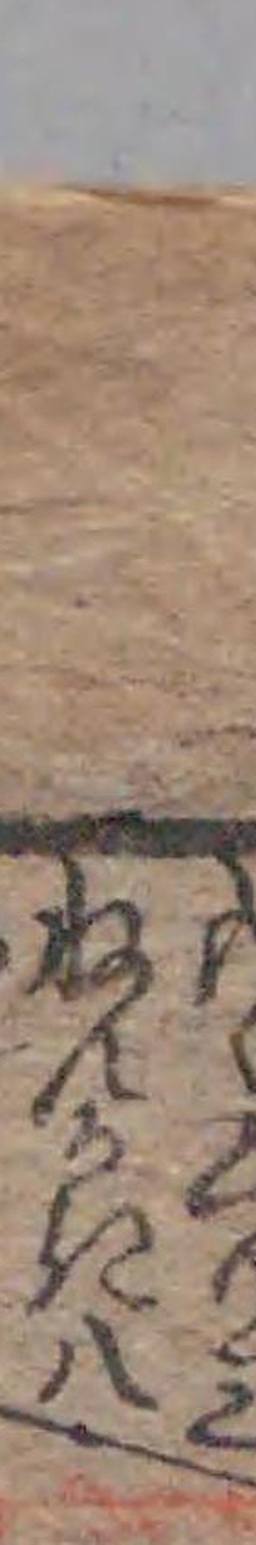ねんかき八
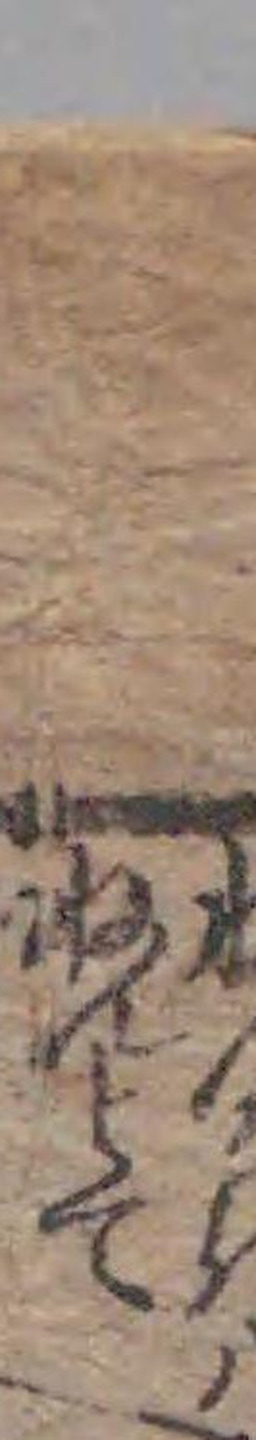ねんして
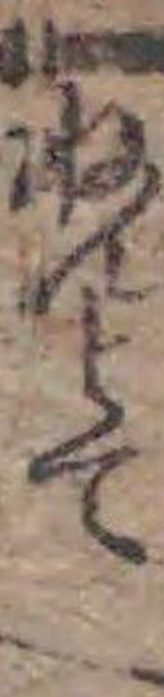ねんして
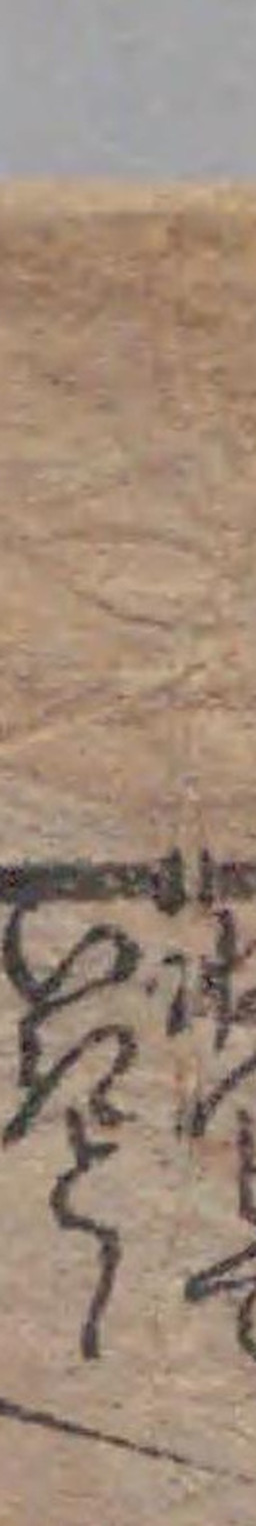いきとし
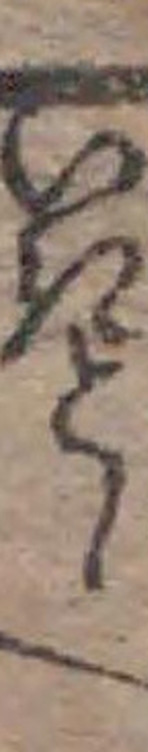いきとし
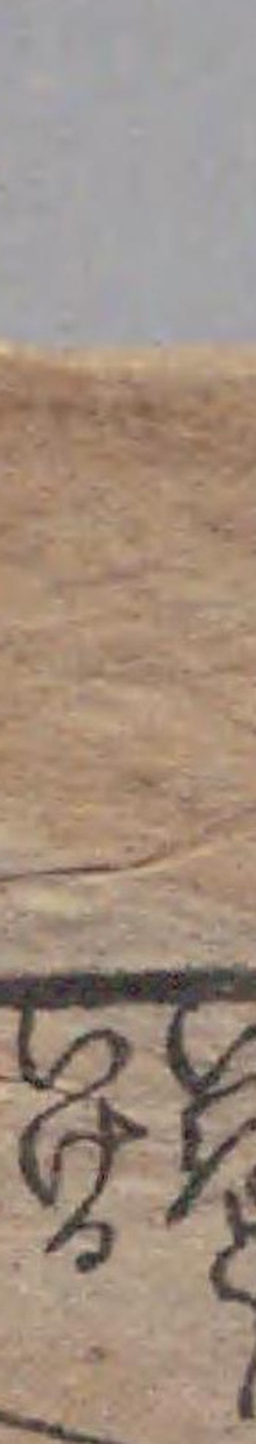いける
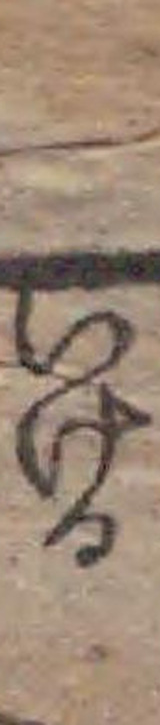いける
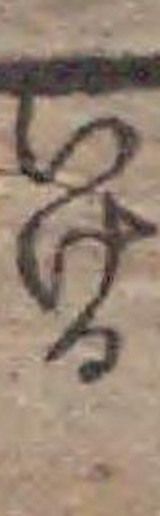いける
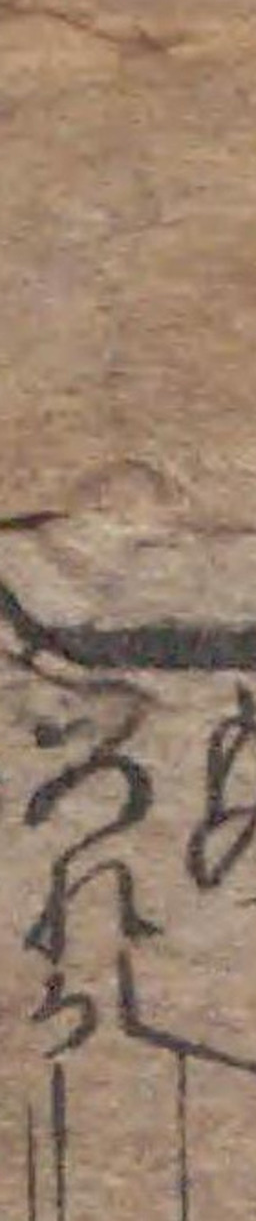いつれか
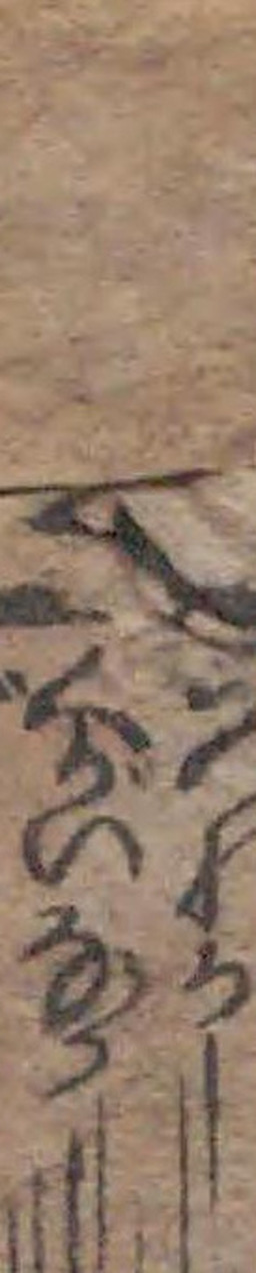くがいなら
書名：化物楽屋異牒 : 2巻
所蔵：国立国会図書館 National Diet Library, JAPAN
